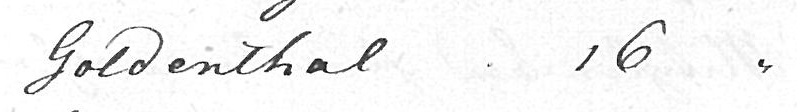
Goldenthal . . 16 "
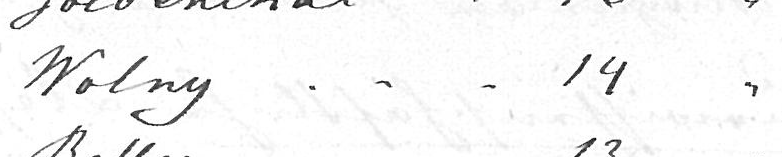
Wolny . . . 14 "
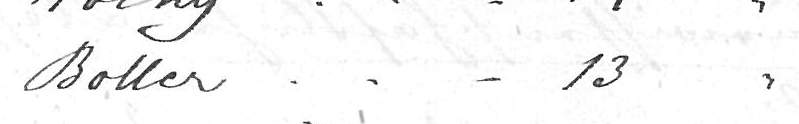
Boller . . . 13 "
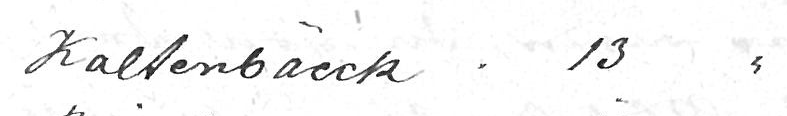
Kaltenbaeck . . . 13 "
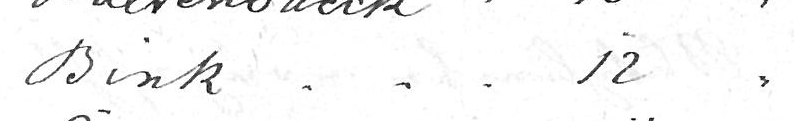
Bink . . . 12 "
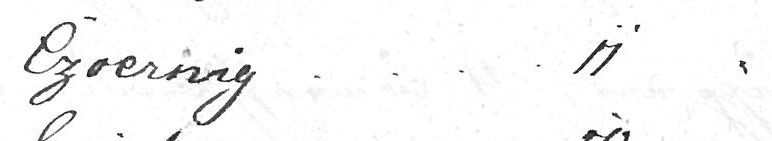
Czoernig . . . 11 "
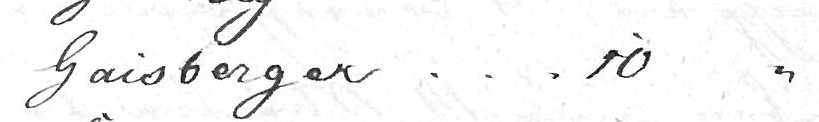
Gaisberger . . . 10 "
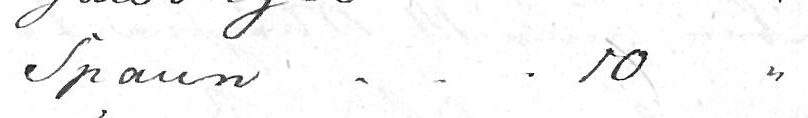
Spaun . . . 10 "
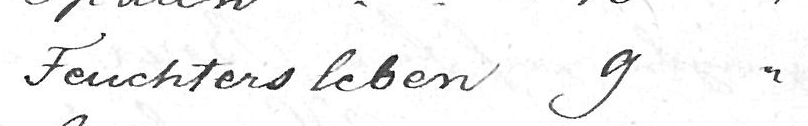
Feuchtersleben . 9 "
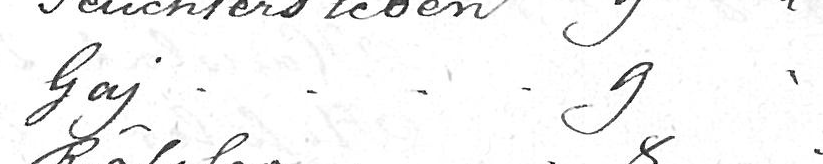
Gaj . . . . 9 "
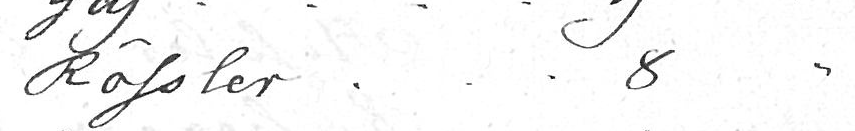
Rössler . . . 8 "
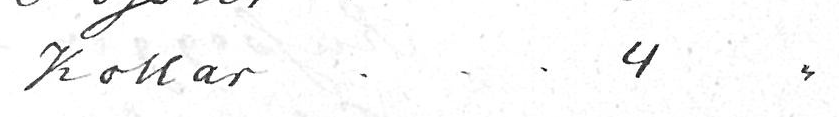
Kollar . . . . 4"
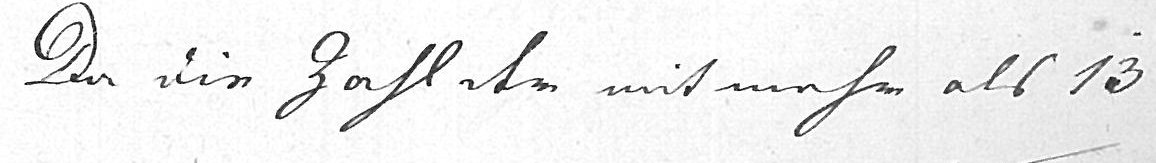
Da die Zahl der mit mehr als 13
